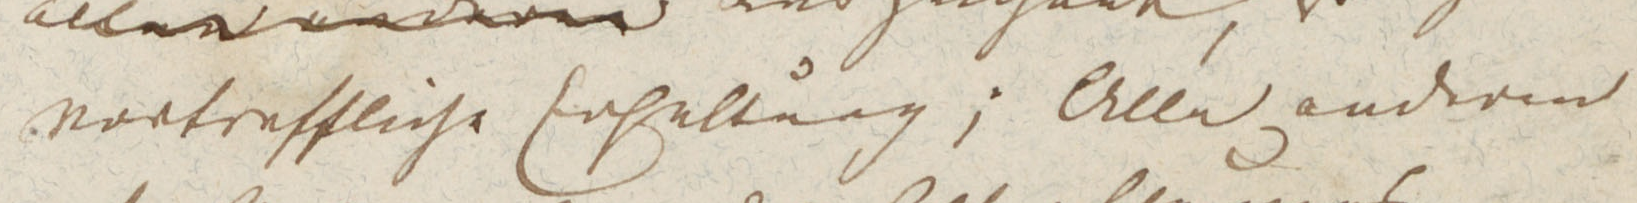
vortreffliche Erhaltung; Alle anderen
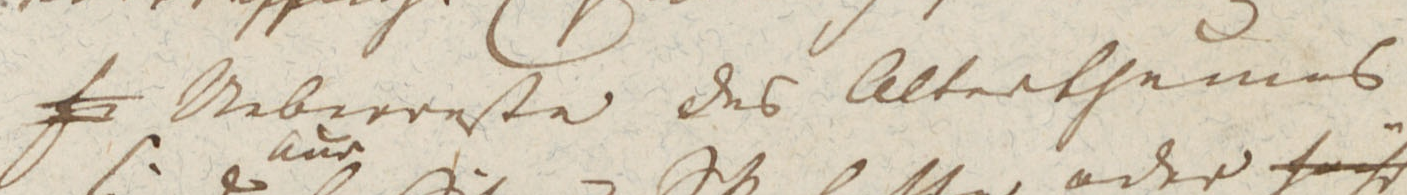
f Ueberreste des Alterthumes
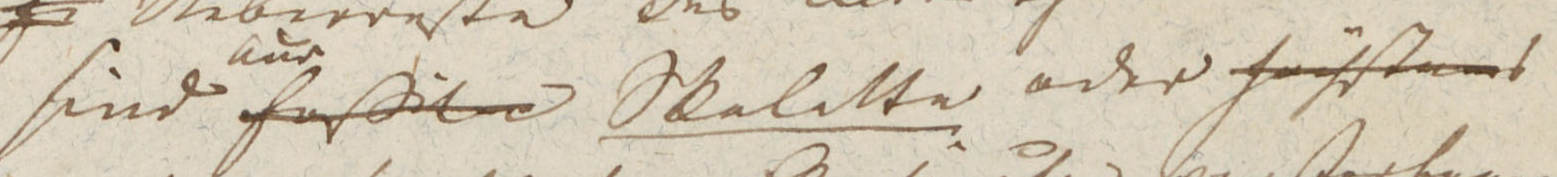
sind nur fossile Skelette oder höchstens
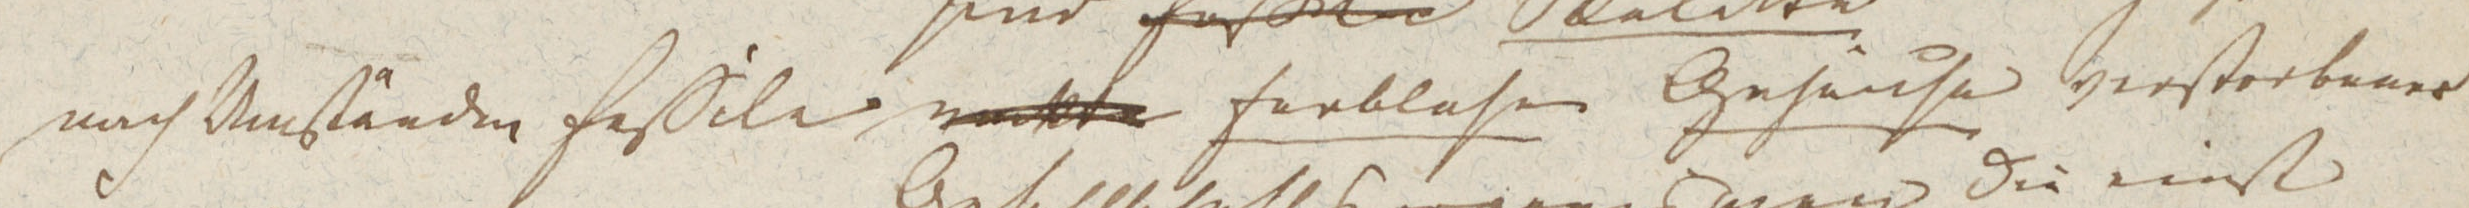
nach Umständen fossile nackte farblose Gehäuse verstorbener
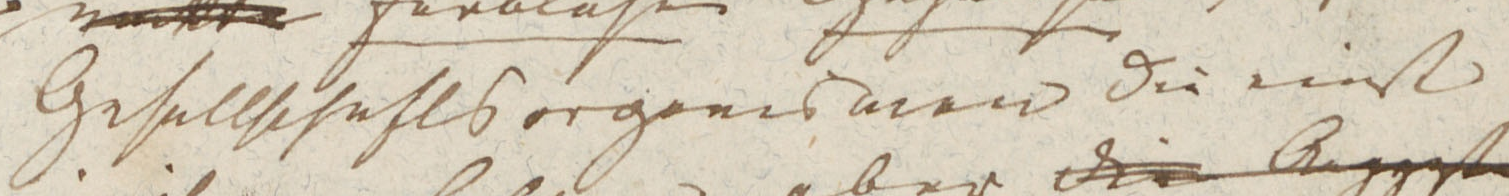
Gesellschaftsorganismen die einst
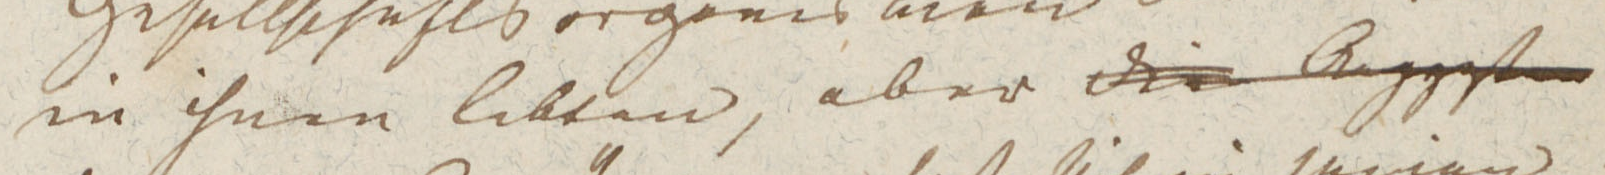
in ihnen lebten, aber die Aegypter
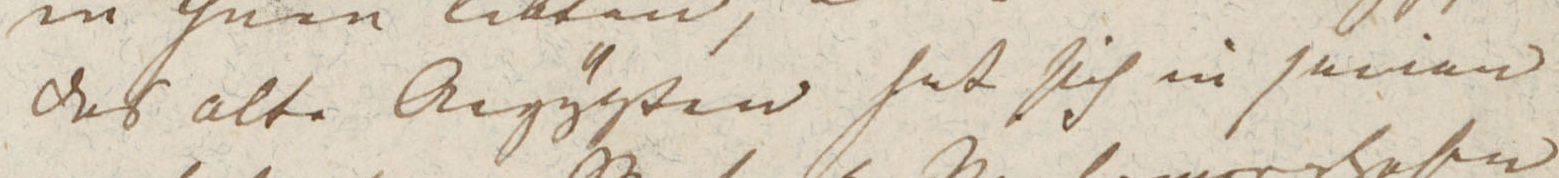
das alte Aegypten hat sich in seinen
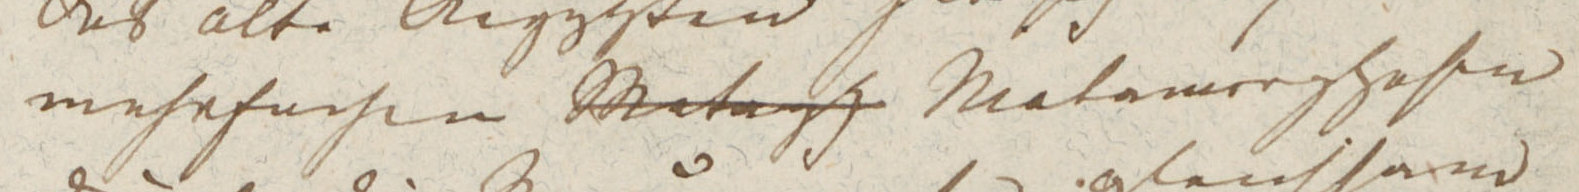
mehrfachen Metaph Metamorphosen
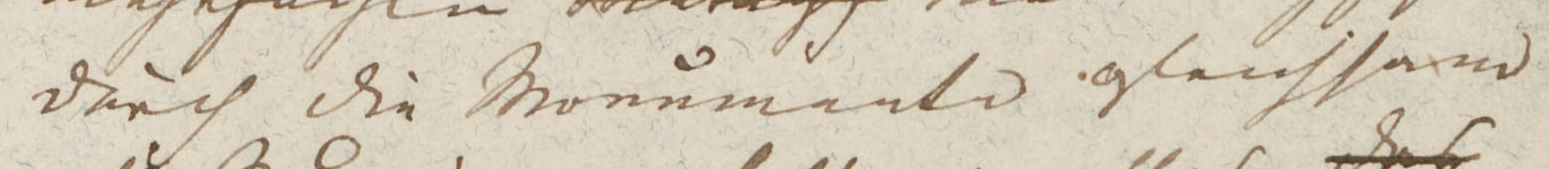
durch die Monumente gleichsam
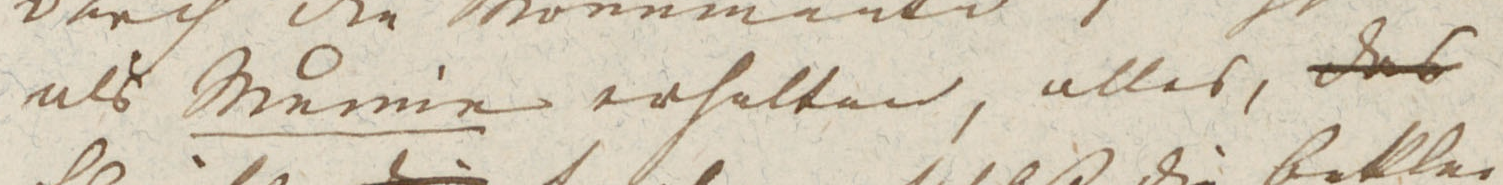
als Mumie erhalten, alles, das
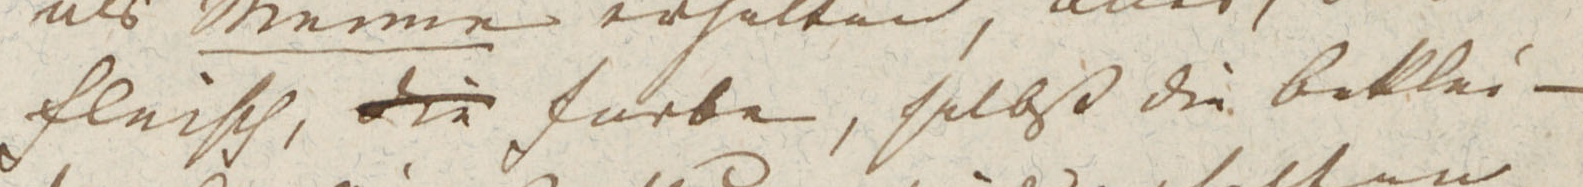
Fleisch, die Farbe, selbst die beklei-
